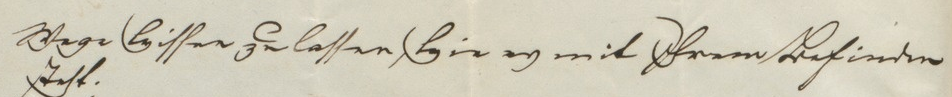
Wege wissen zu lassen, wie es mit Ihrem Befinden
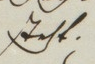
steht.
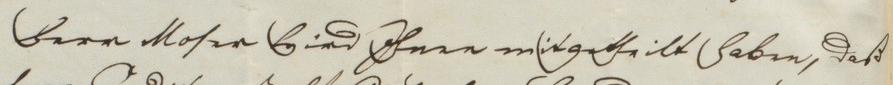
Herr Moser wird Ihnen mitgetheilt haben, daß
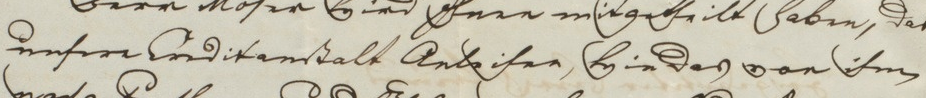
unsere Creditanstalt Anleihen, wie das von ihm
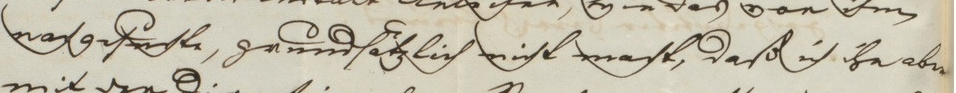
nachgesuchte, grundsätzlich nicht macht, daß ich ihn aber
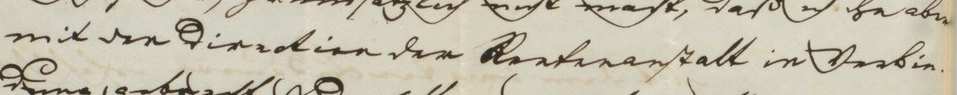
mit der Direction der Rentenanstalt in Verbin-
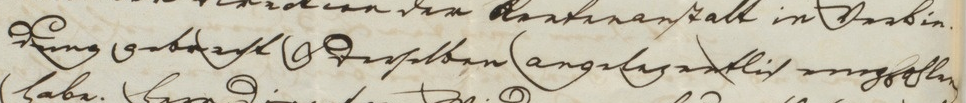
dung gebracht & derselben angelegentlich empfohlen
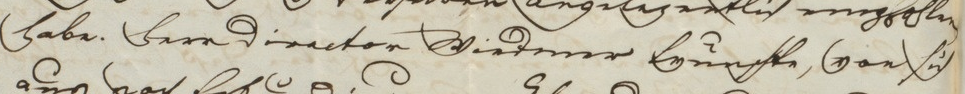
habe. Herr Director Wiedmer wünschte, von sich
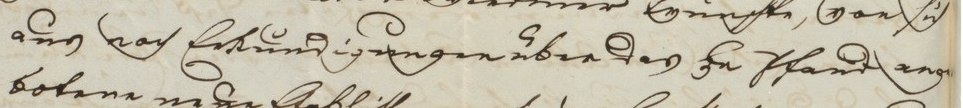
aus noch Erkundigungen über das zu Pfand ange-
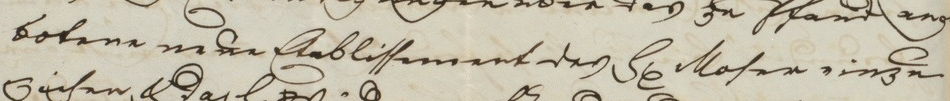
botene neue Etablissement des Herrn Moser einzu-
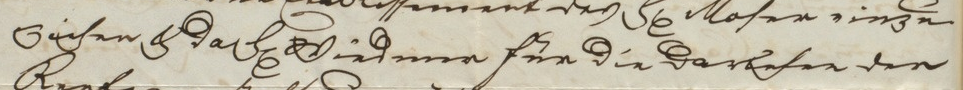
ziehen & da Herr Wiedmer für die Darlehen der
